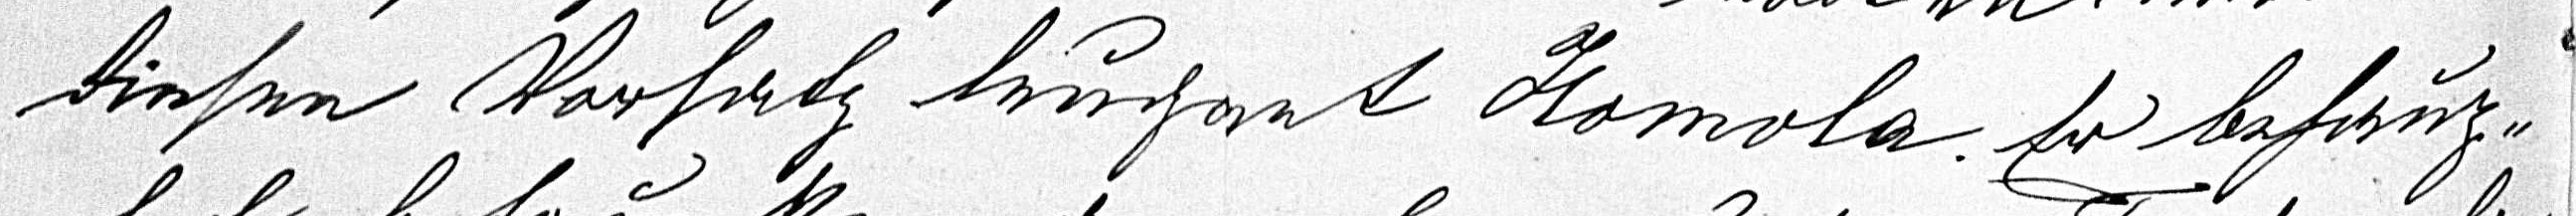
Diesen Vorsatz leugnet Homola. Er befaup¬
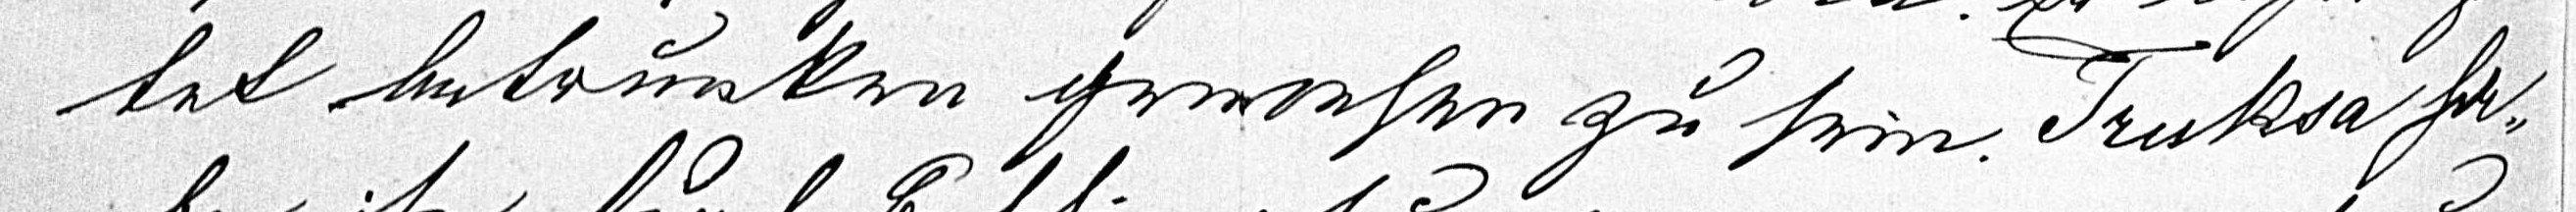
tet betrunken gewesen zu sein. Truksa ha¬
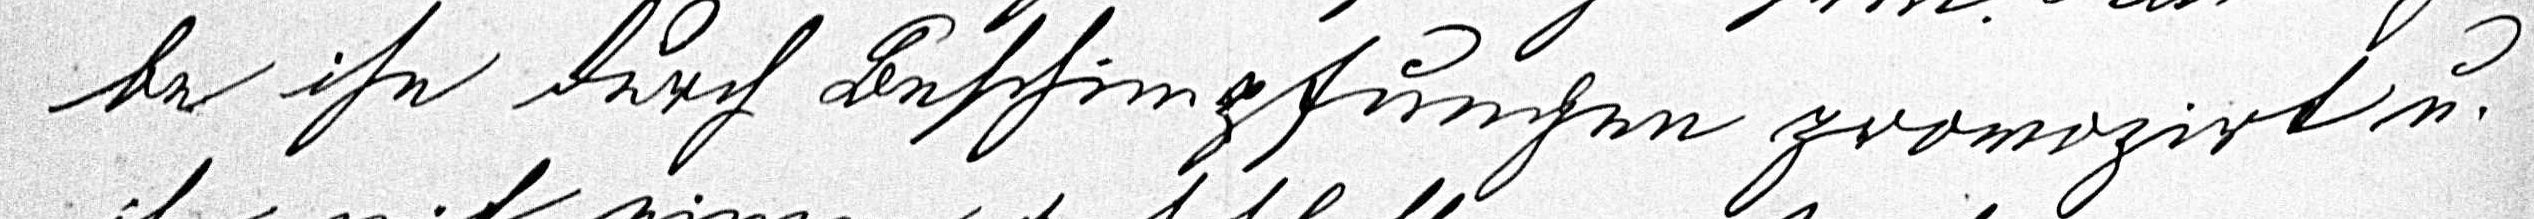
be ihn durch Beschimpfungen provozirt u.
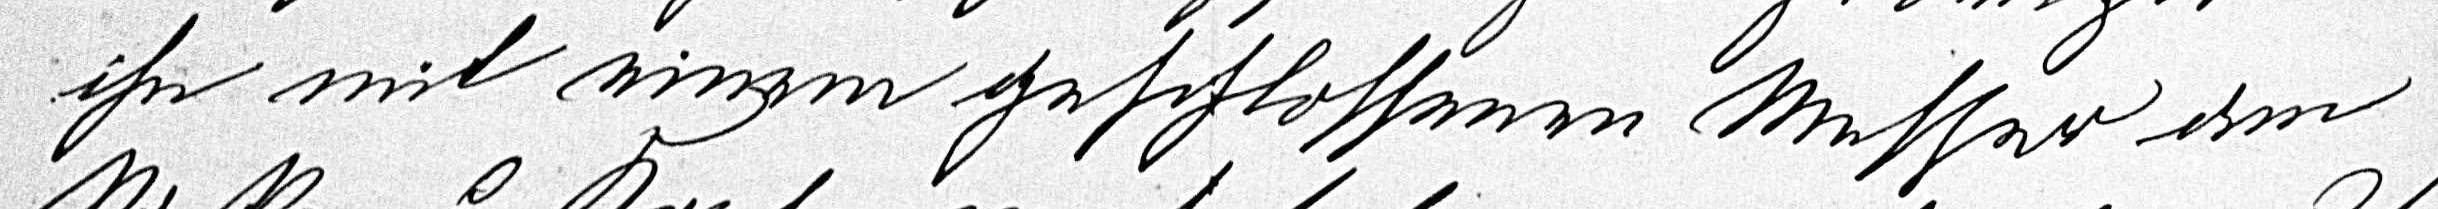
ihn mit einen geschlossenen Messer am
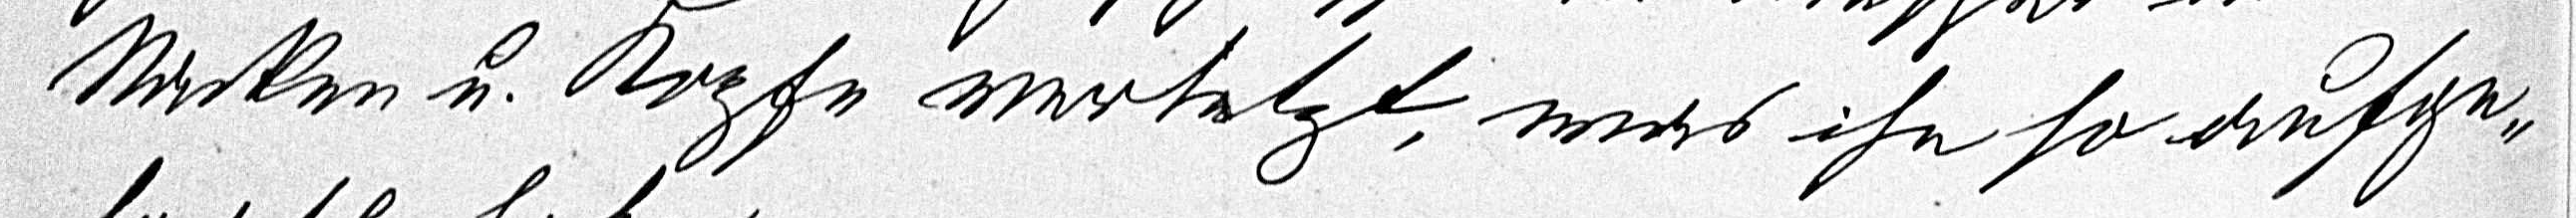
Nachen u. Kopfe verletzt, was ihn so aufge¬
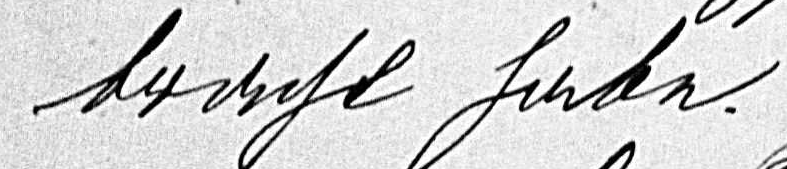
bracht habe.
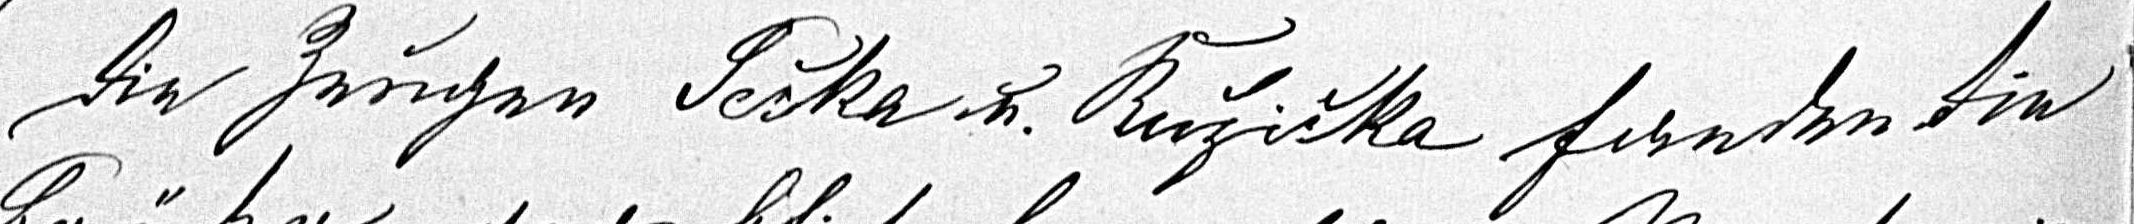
Die Zeugen Sečka u. Bužička fanden die
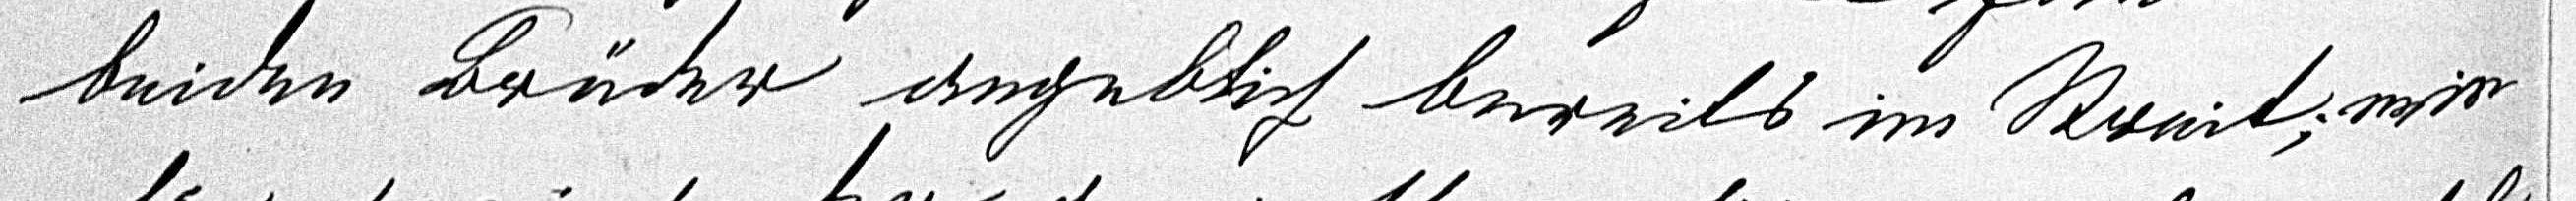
beiden Brüder angeblich bereits im Streit, wie
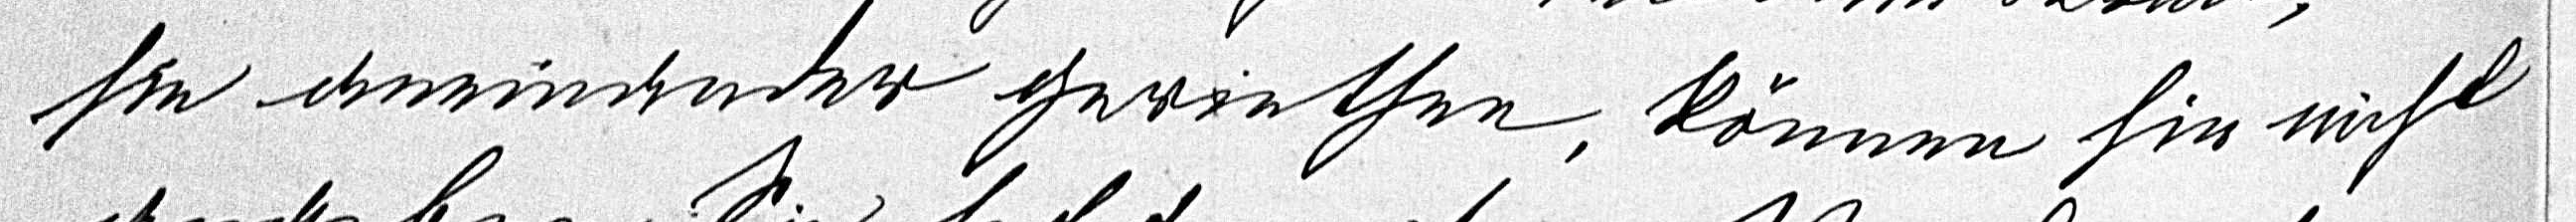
sie aneinander geriethen, können sie nicht
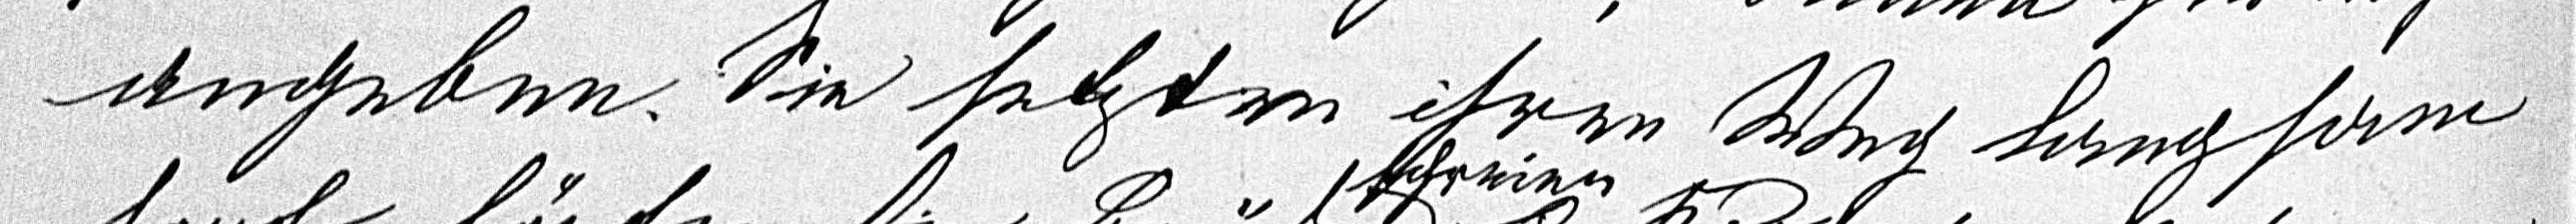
angeben. Sie setzten ihren Weg langsam
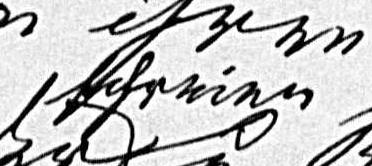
schreien
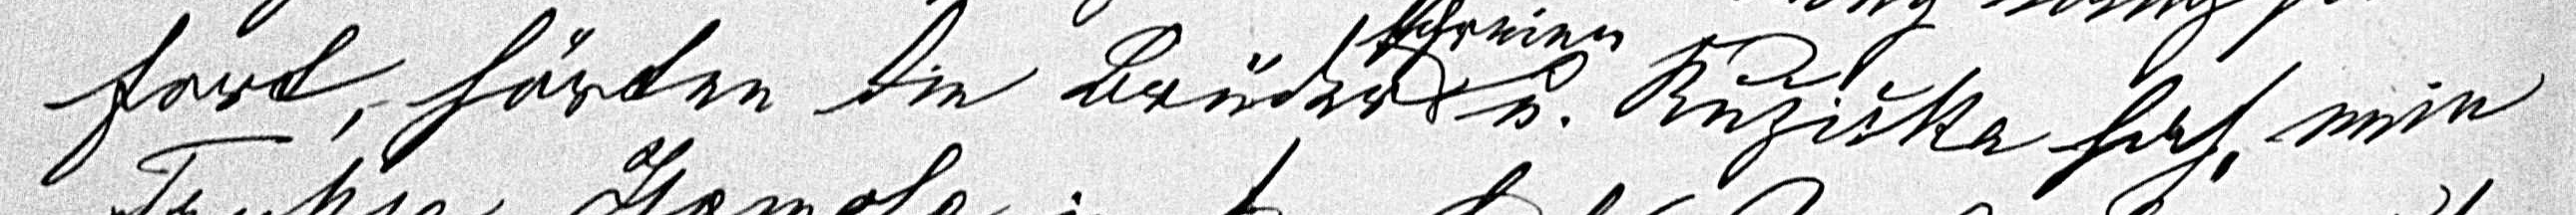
fort, hörten die Brüder u. Bužička sah, wie
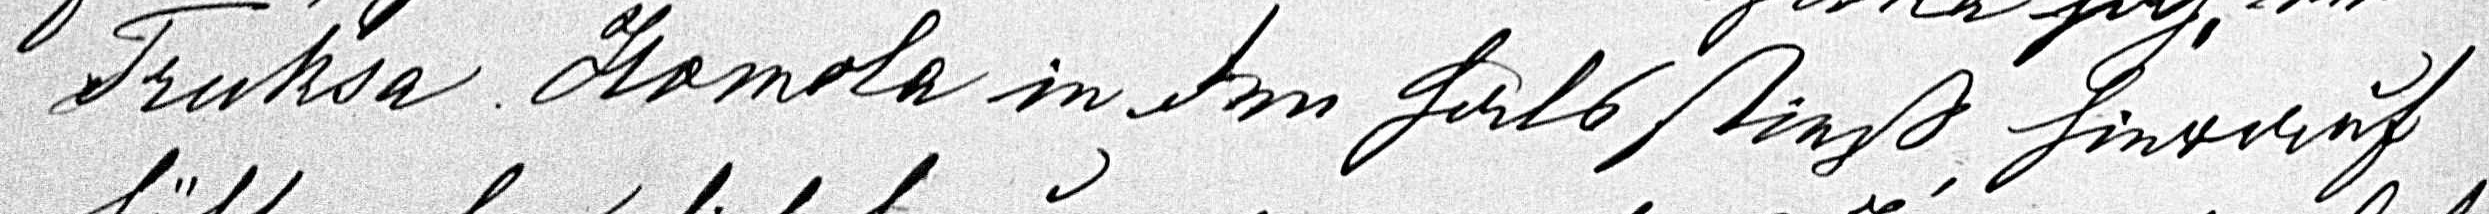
Truksa Homola in den Hals stieß, hierauf
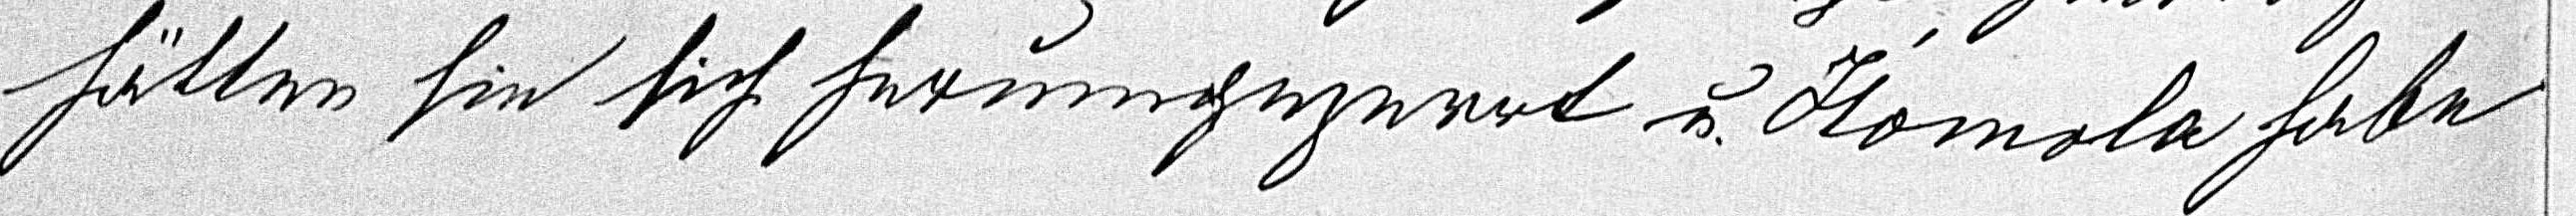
hätten sie sich herumgezerrt u. Homola habe
